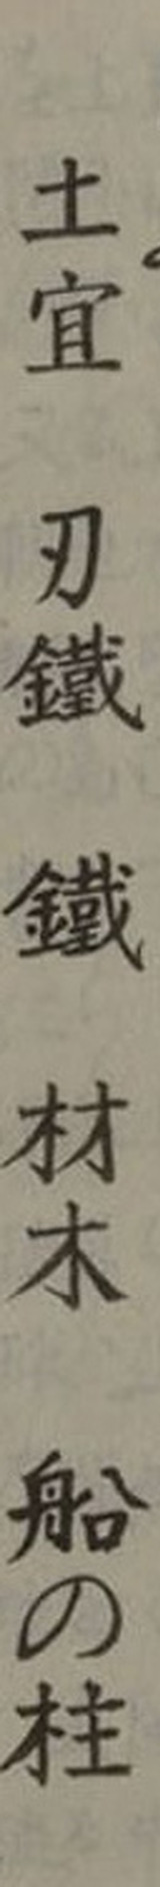土宜刀鐵鐵材木船の柱
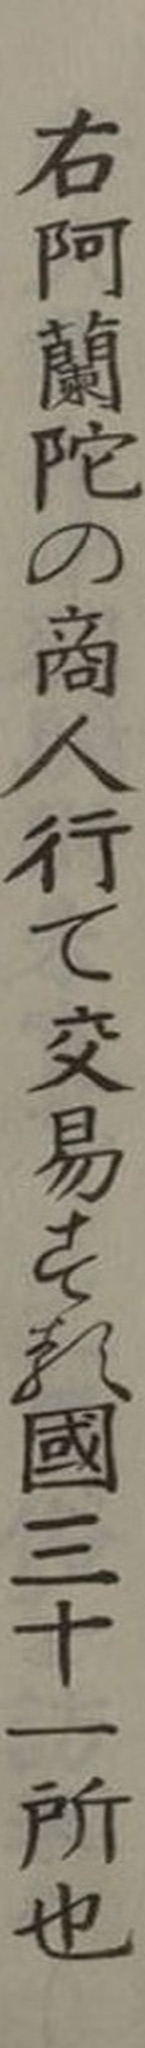右阿蘭陀の商人行て交易する國三十一所也

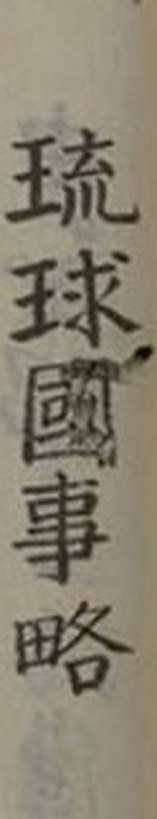琉球國事略
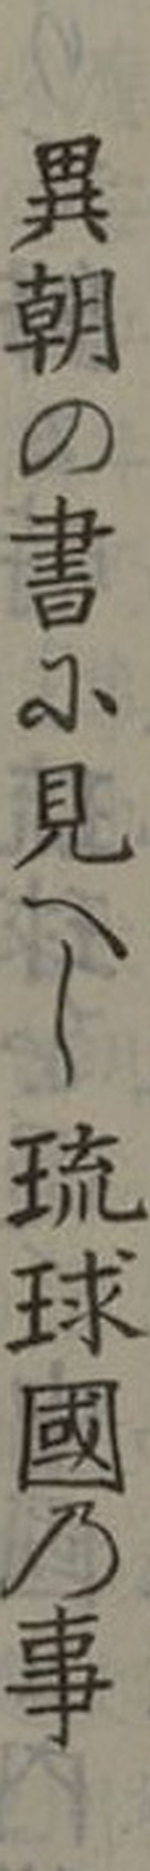異朝の書に見へし琉球國の事
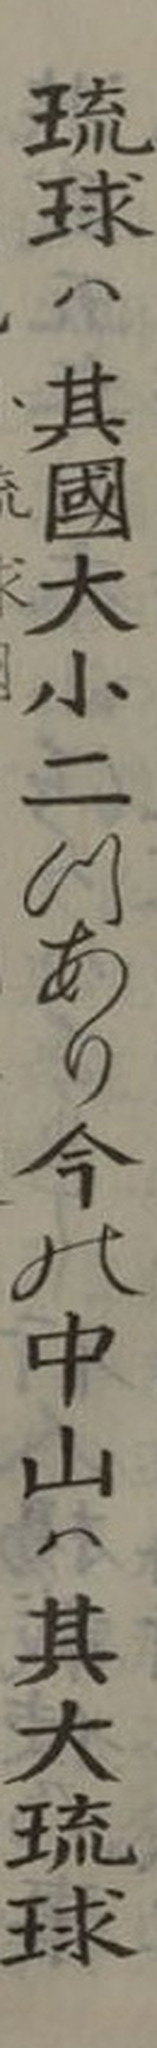琉球は其國大小二つあり今の中山は其大琉球
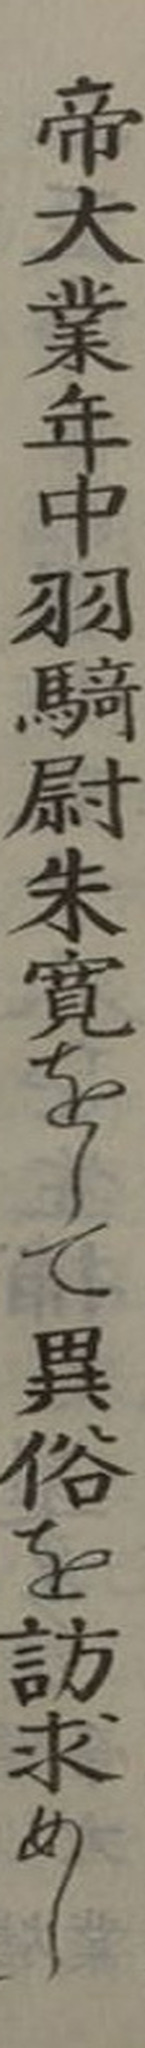帝大業年中羽騎尉朱寛をして異俗を訪求めし
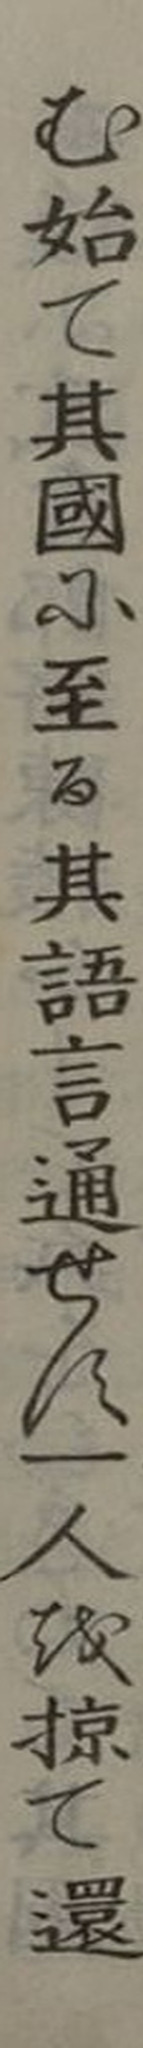む始て其國に至る其語言通せす一人を掠て還

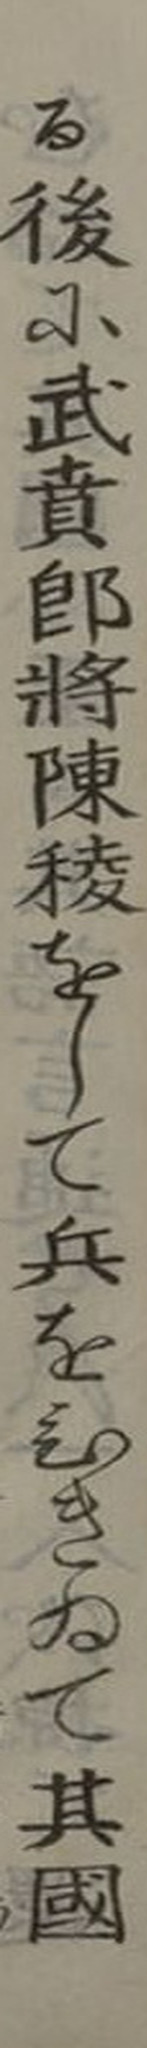る後に武賁郎將陳稜をして兵をひきゐて其國
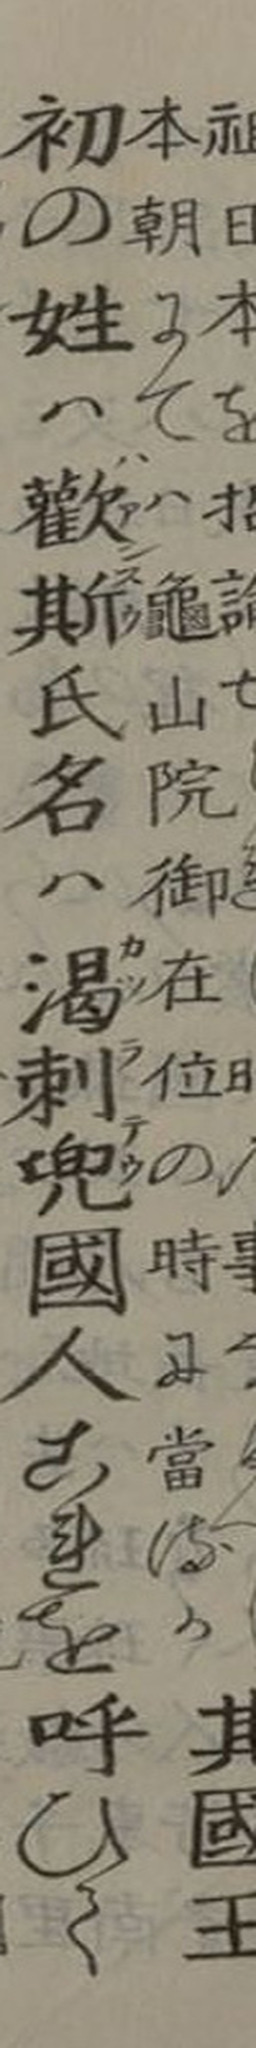初の姓は歡斯氏名は渇刺兜國人これを呼ひて
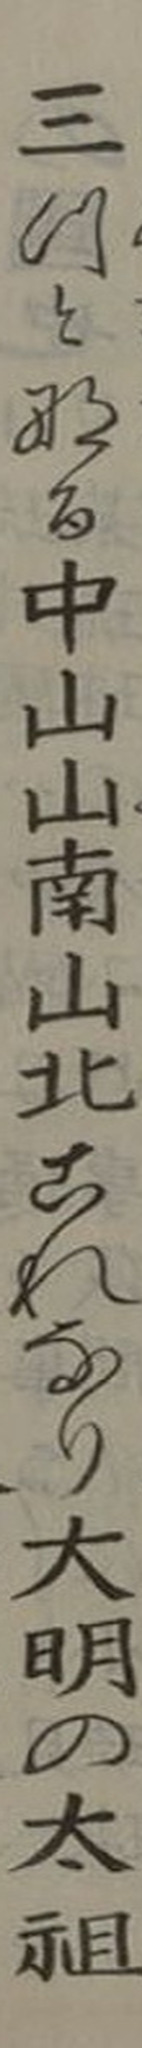三つとなる中山山南山北これなり大明の太祖
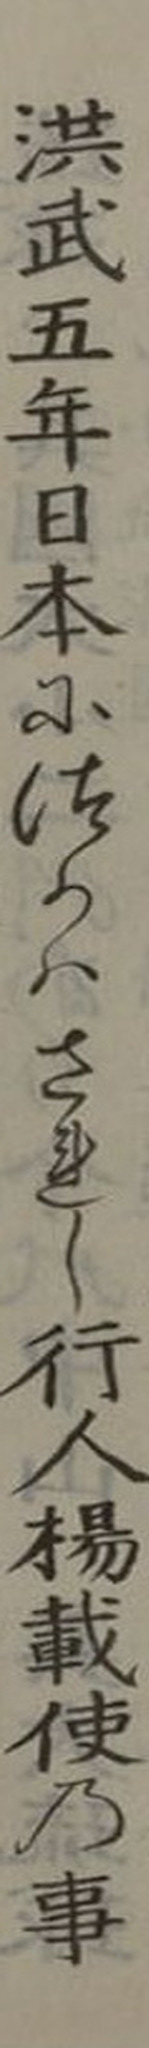洪武五年日本につかはされし行人楊載使の事
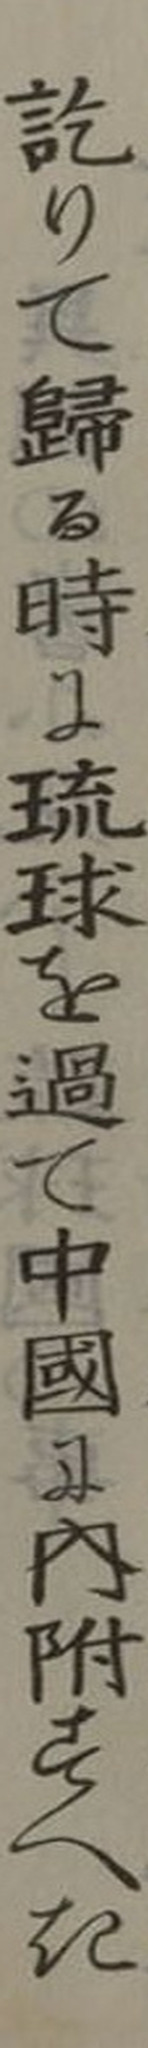訖りて歸る時に琉球を過て中國に内附すへき
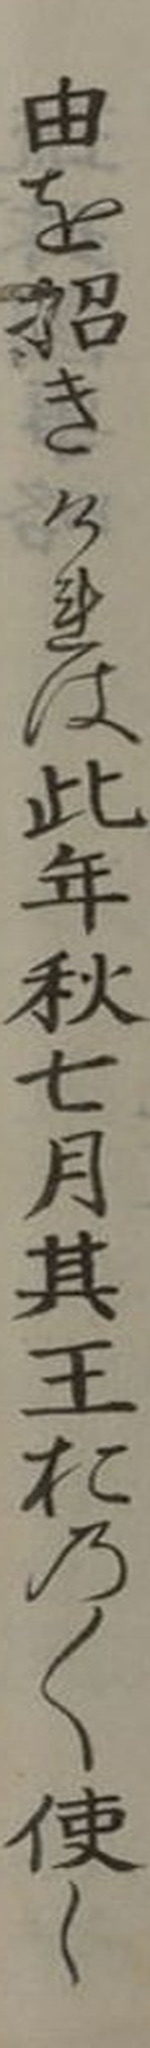由を招きけれは此年秋七月其王おの〳〵使し
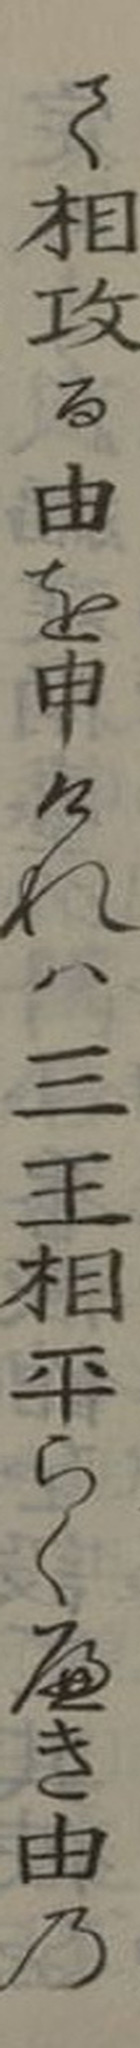て相攻る由を申けれは三王相平らくへき由の
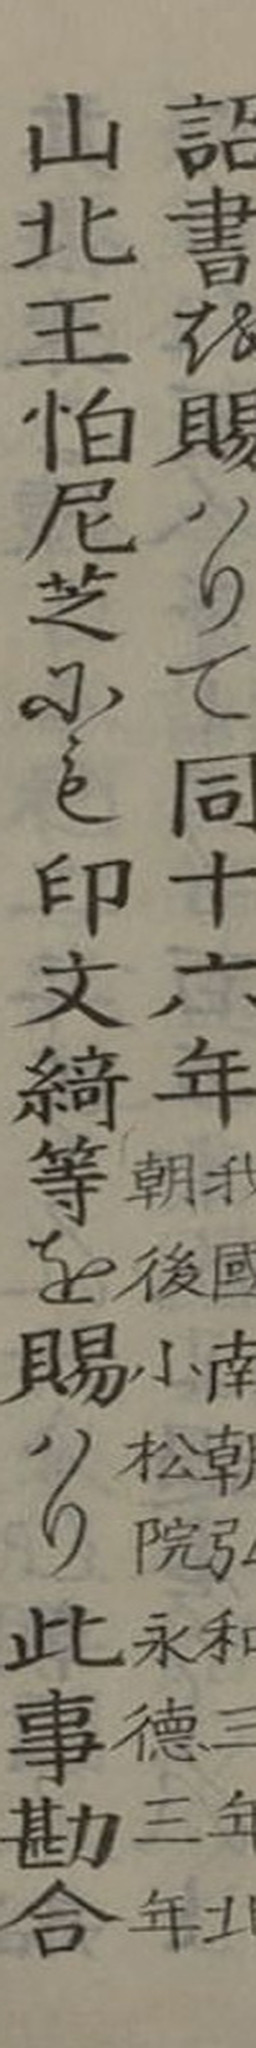山北王怕尼芝にも印文綺等を賜はり此事勘合
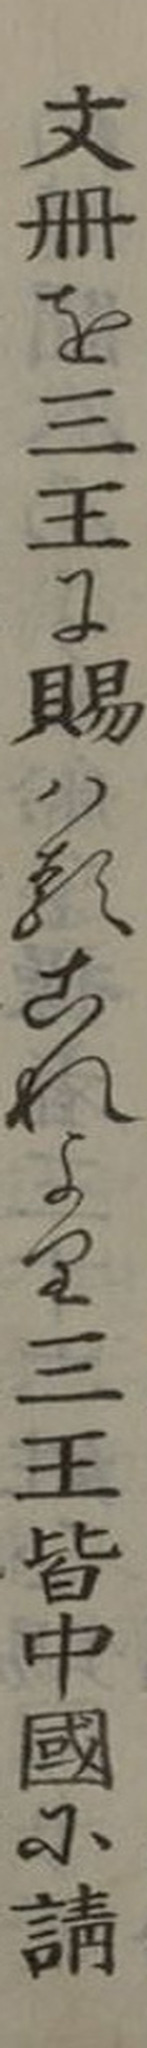文冊を三王に賜はるこれより山王皆中國に請
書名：骨董録
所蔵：University of the Ryukyus Library
